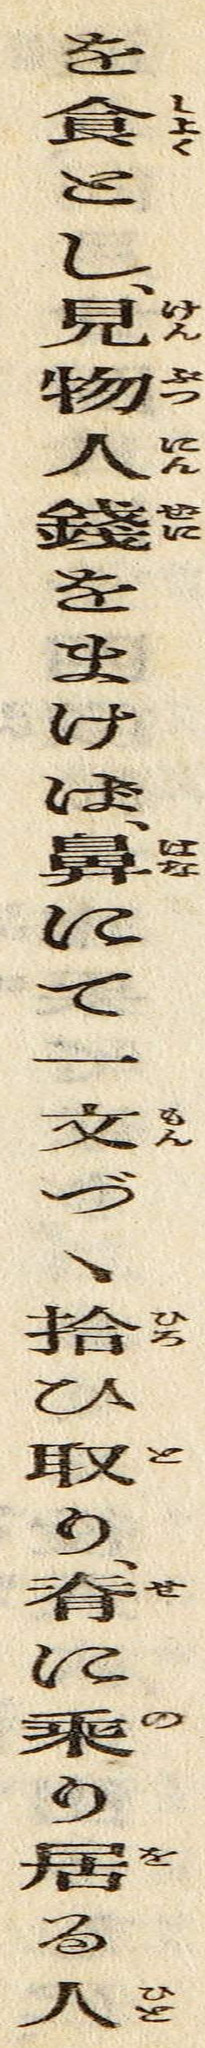を食とし、見物人銭をまけば、鼻にて一文づヽ拾ひ取り、脊に乗り居る人
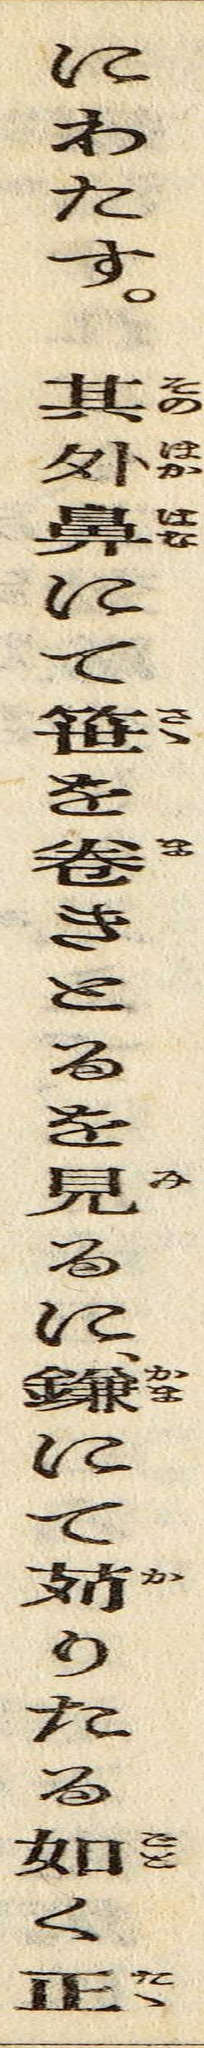にわたす。其外鼻にて笹を巻きとるを見るに、鎌にて苅りたる如く正
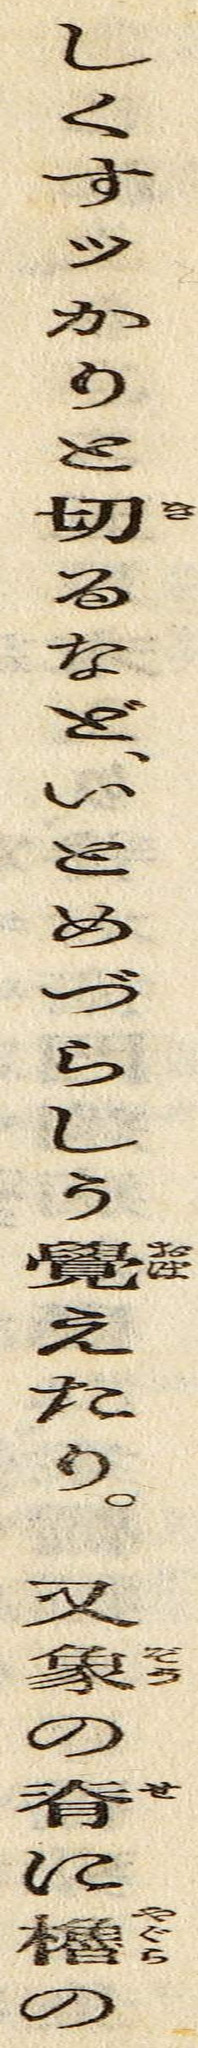しくすツかりと切るなど、いとめづらしう覚えたり。又象の脊に櫓の
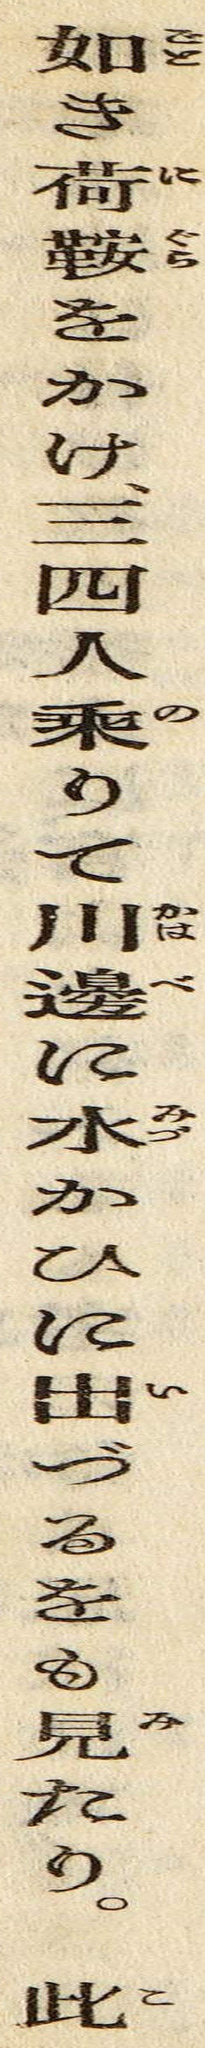如き荷鞍をかけ、三四人乗りて川辺に水かひに出づるをも見たり。此

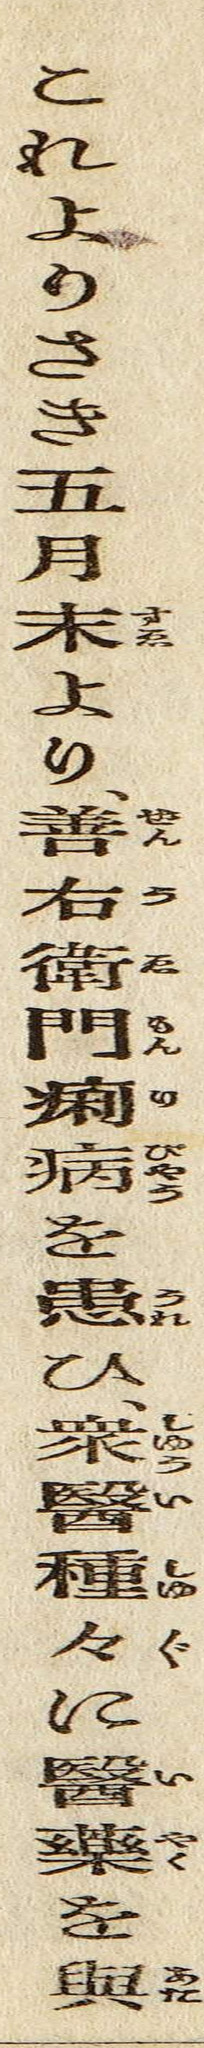これよりさき五月末より、善右衛門痢病を患ひ、衆医種々に医薬を与
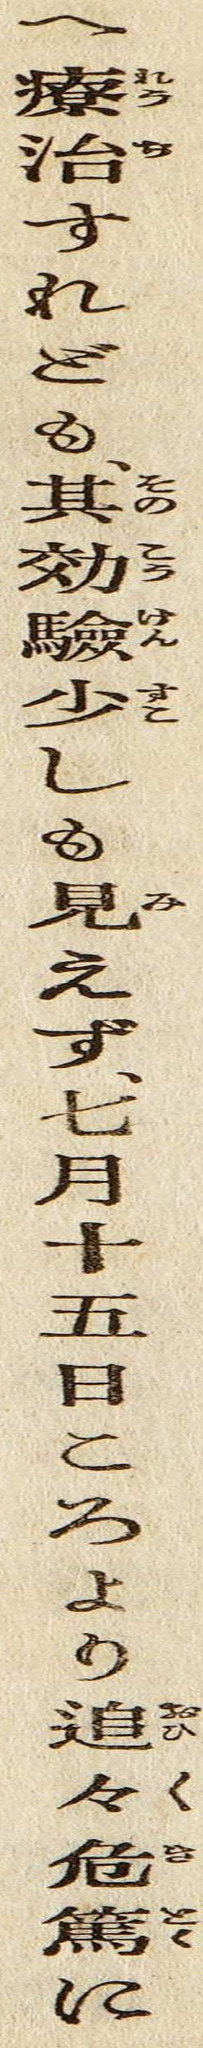へ療治すれども、其効験少しも見えず、七月十五日ころより追々危篤に
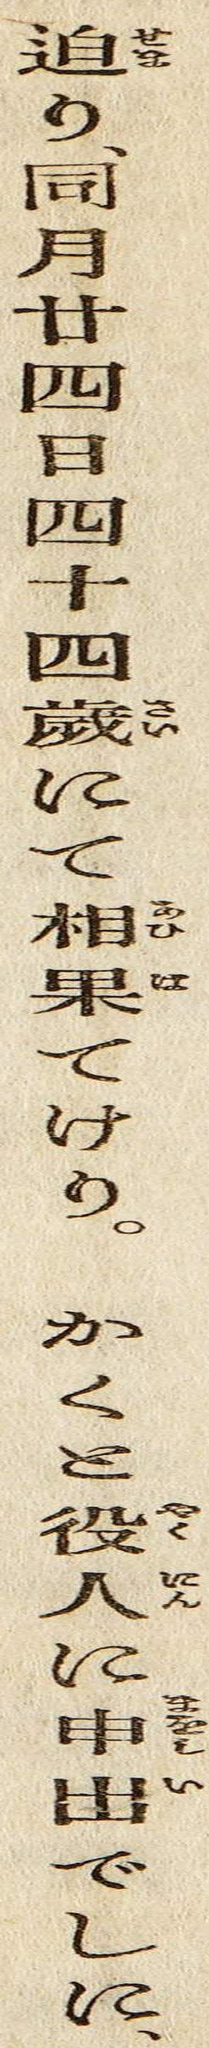迫り、同月廿四日四十四歳にて相果てけり。かくと役人に申出でしに、
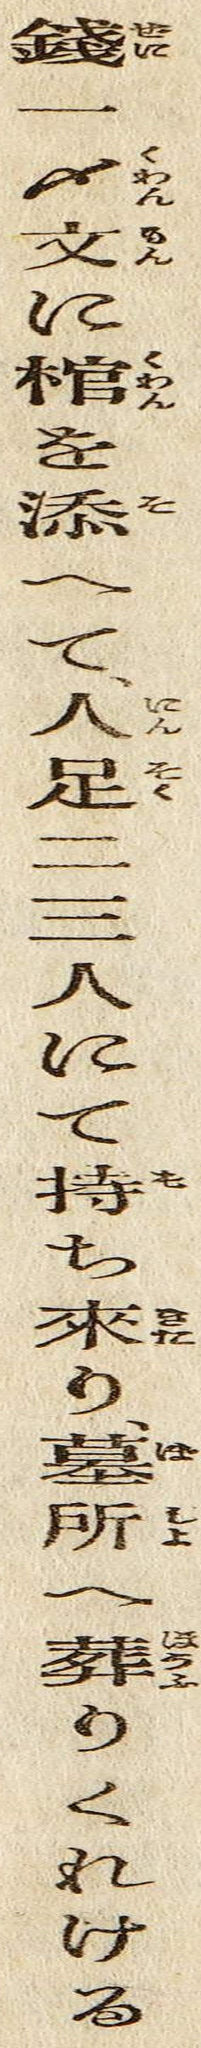銭一貫文に棺を添へて、人足二三人にて持ち来り、墓所へ葬りくれける
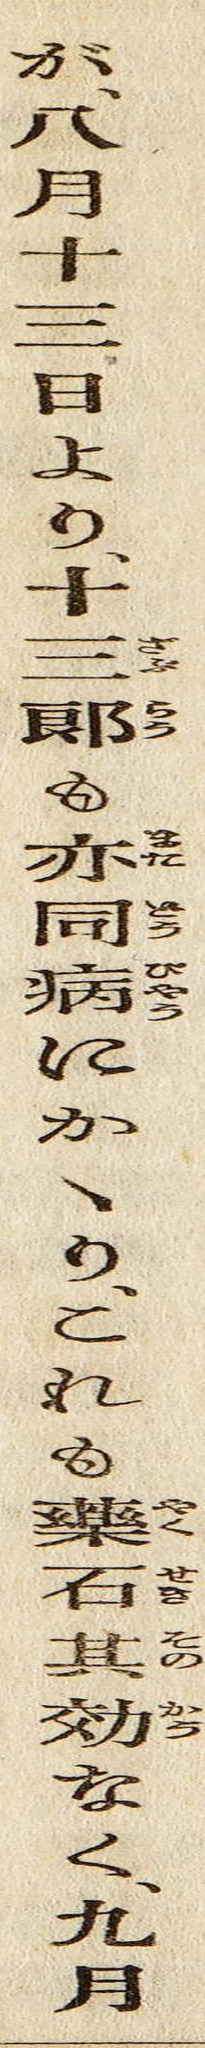が、八月十三日より、十三郎も亦同病にかヽり、これも薬石其効なく、九月
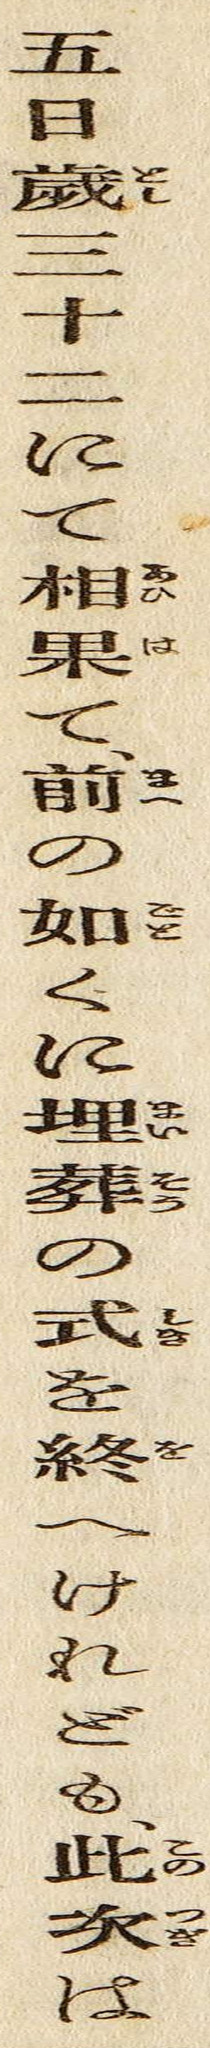五日歳三十二にて相果て、前の如くに埋葬の式を終へけれども、此次は
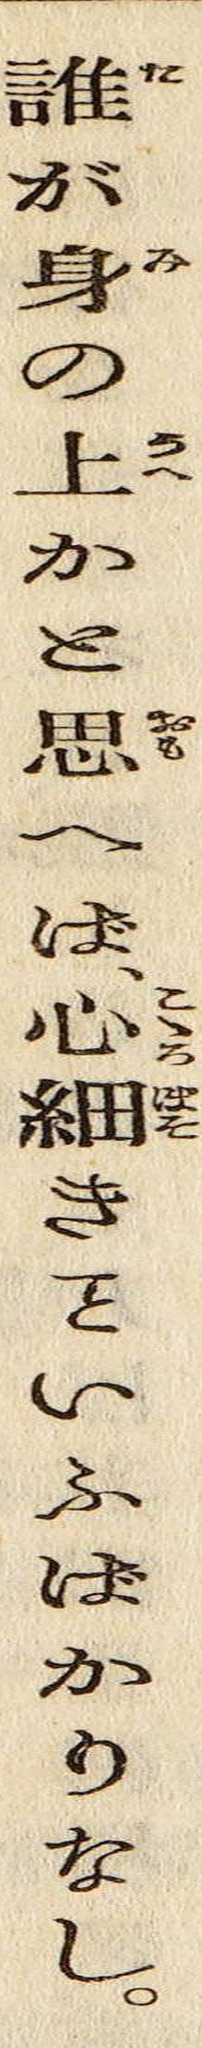誰が身の上かと思へば、心細きこといふばかりなし。
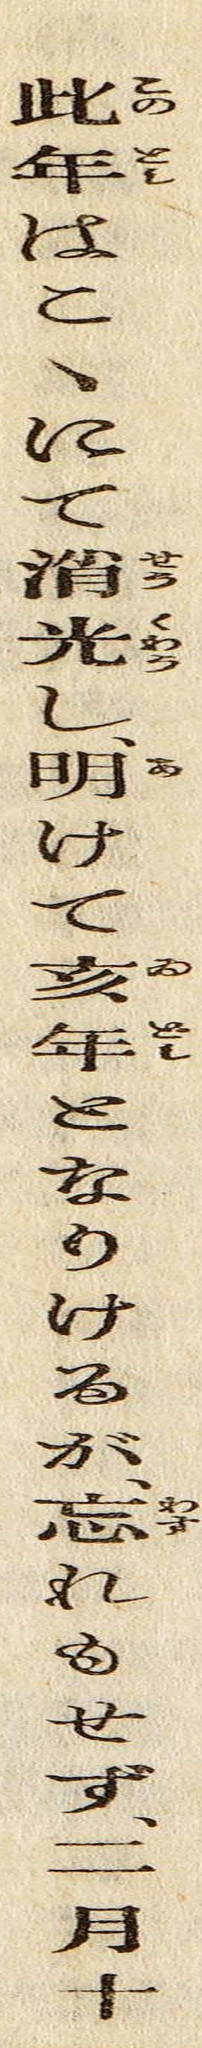此年はこヽにて消光し、明けて亥年となりけるが、忘れもせず、二月十
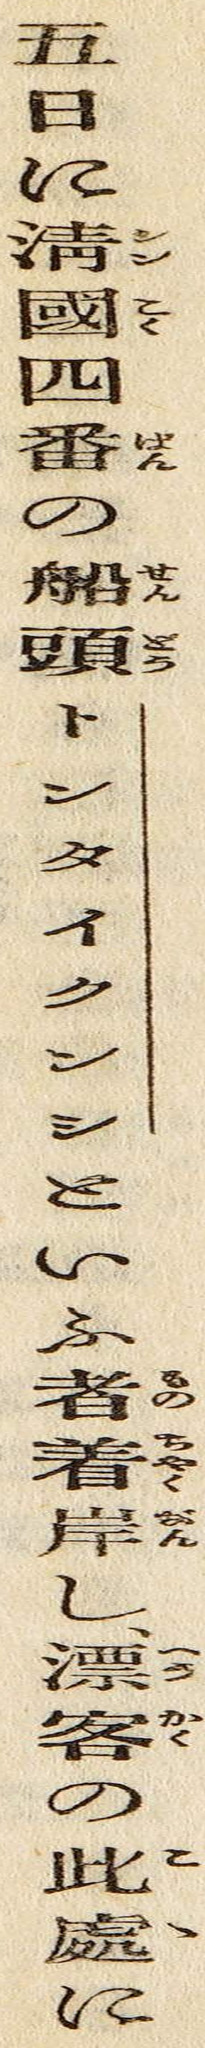五日に清国四番の船頭トンタイクンシといふ者着岸し、漂客の此処に
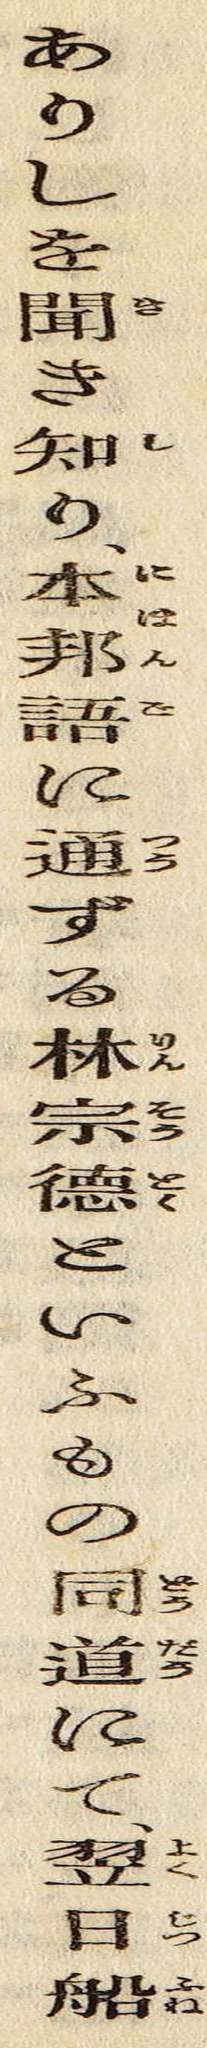ありしを聞き知り、本邦語に通ずる林宗徳といふもの同道にて、翌日船
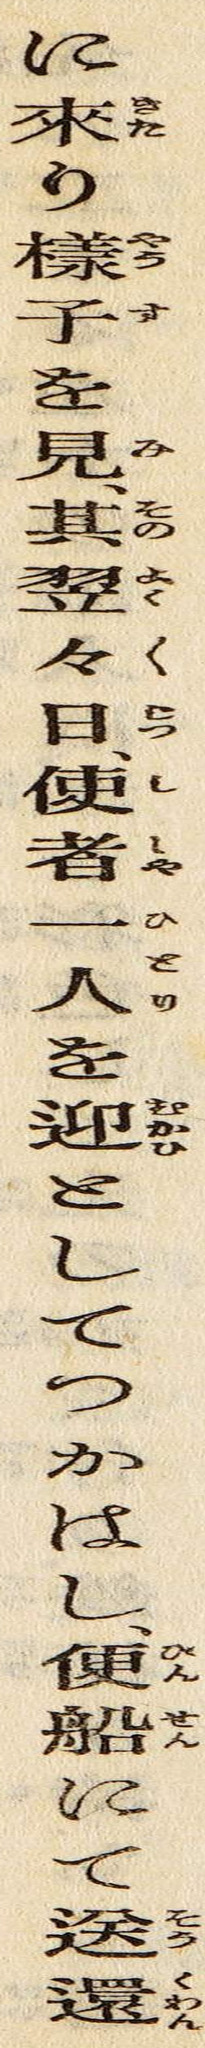に来り様子を見、其翌々日、使者一人を迎としてつかはし、便船にて送還
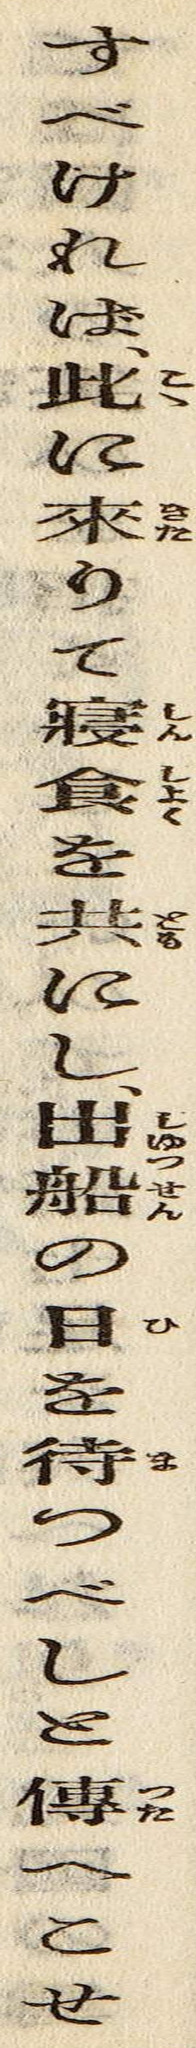すべければ、此に来りて寝食を共にし、出船の日を待つべしと伝へこせ
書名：日本漂流譚
